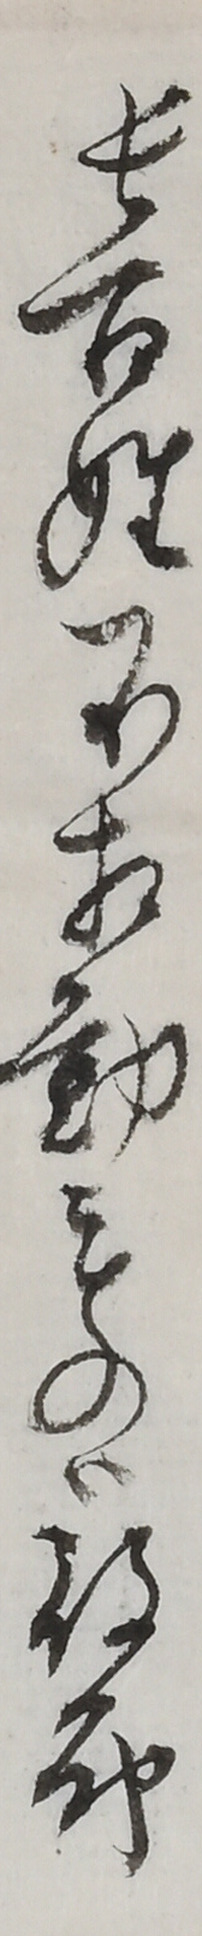長百姓不相勤ものハ役筋
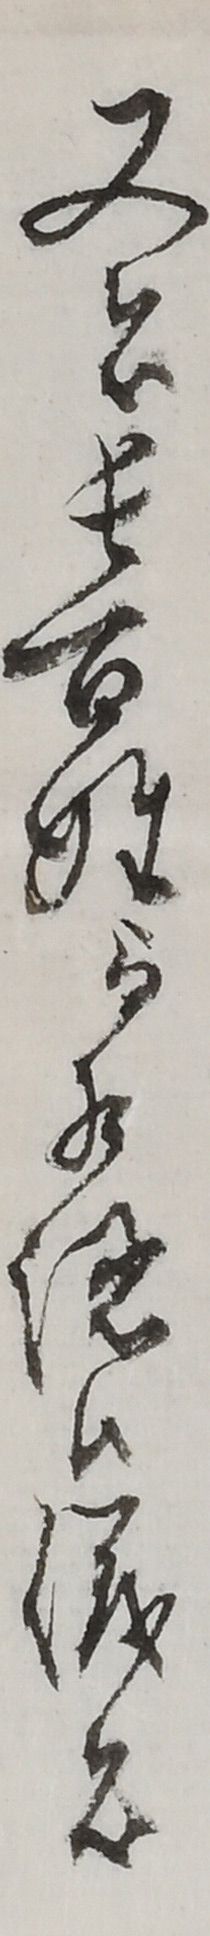又は長百姓と相認候儀は
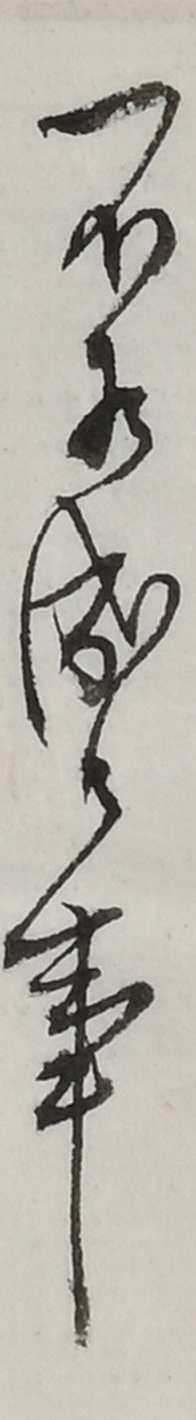不相成候事
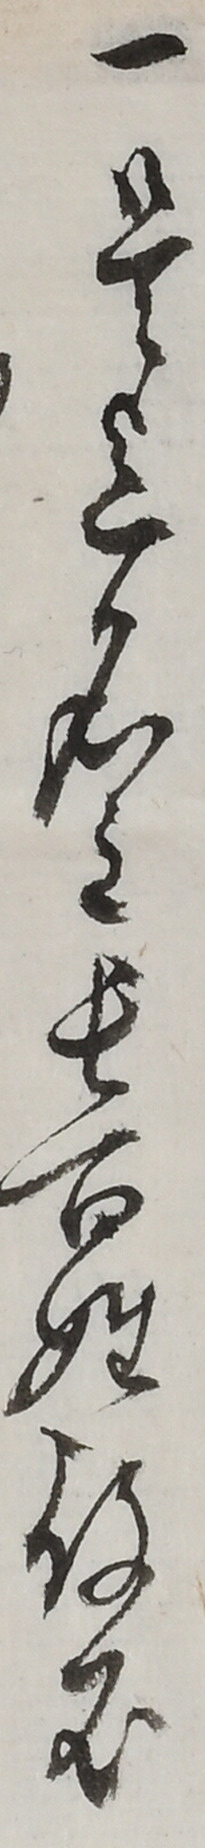一是迄名主長百姓役相勤
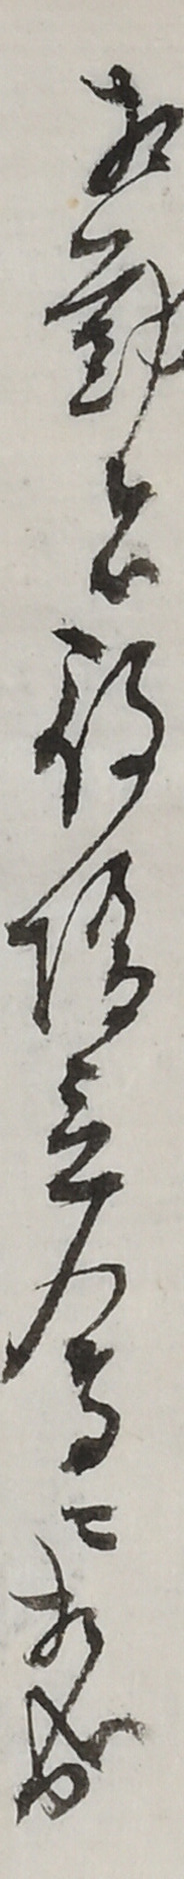相勤者役場立会ニ相成
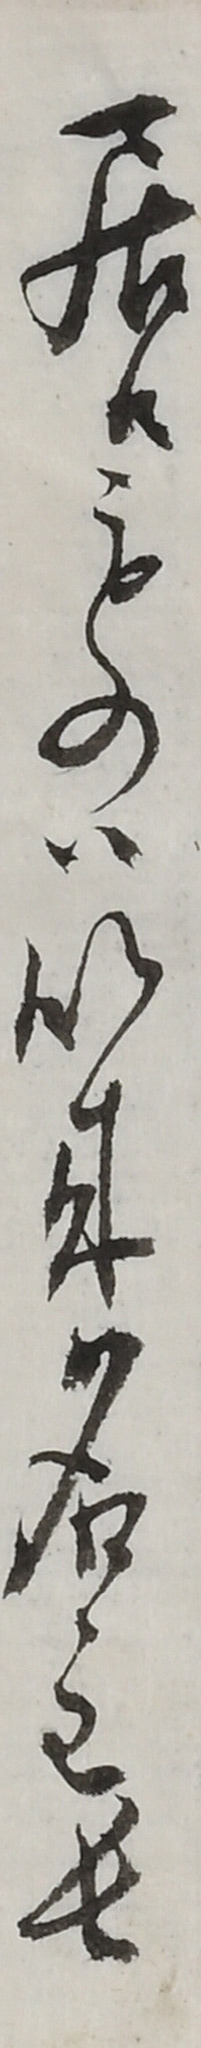居候ものハ以来名主長
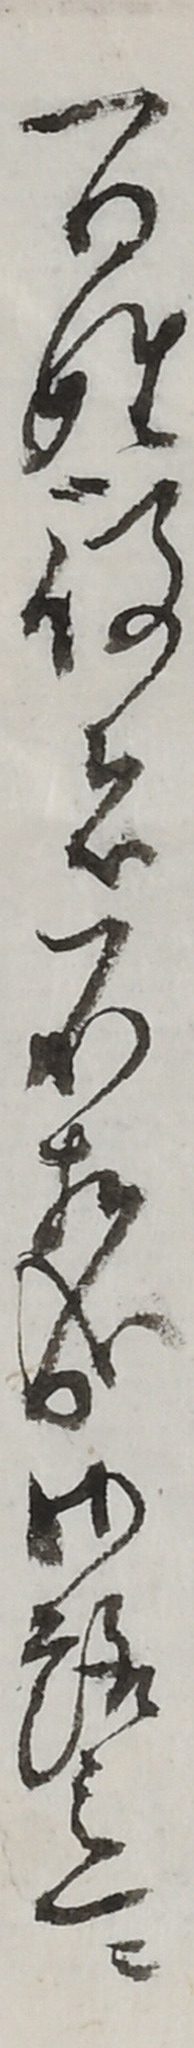百姓役は不相成候趣迄ニ
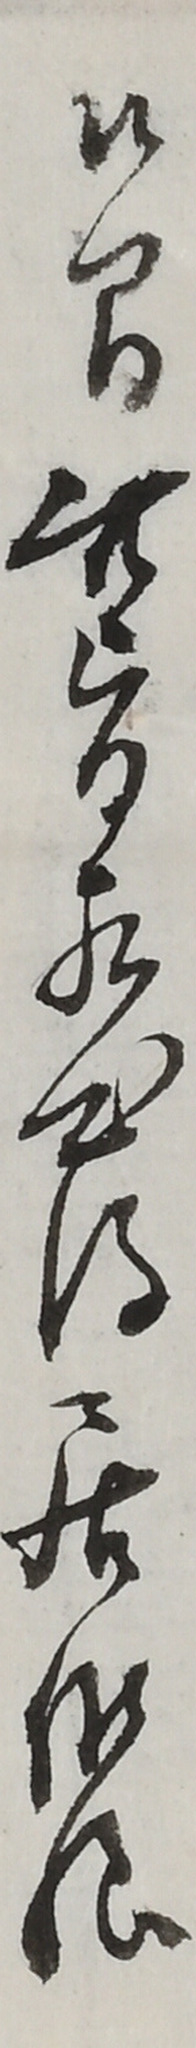候間此旨相心得居候様
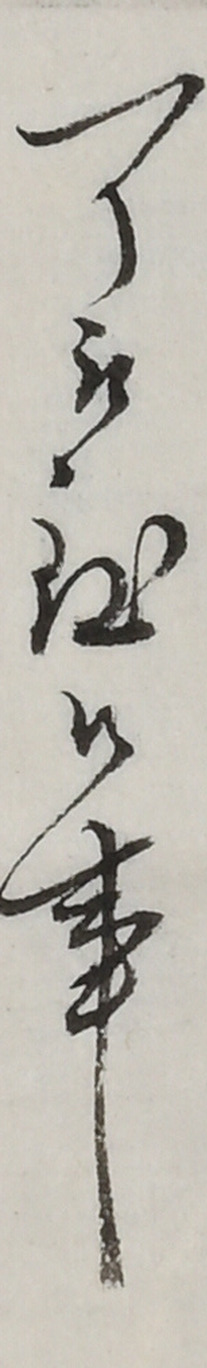可被致候事

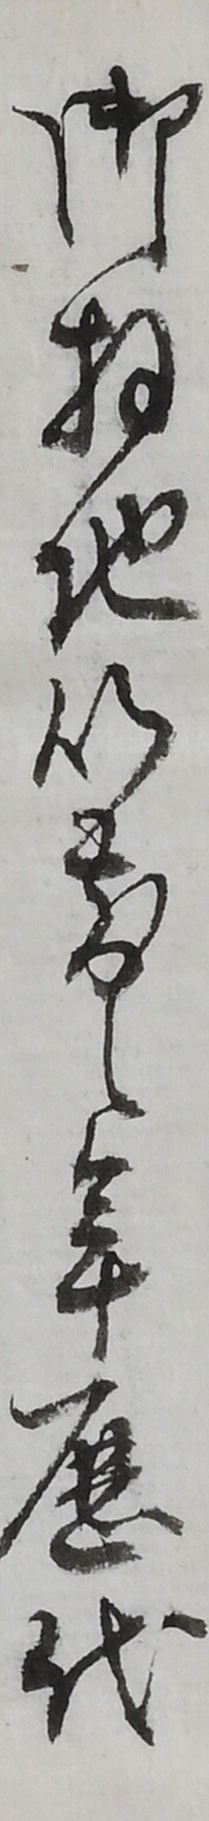御拝地以前之年歴代
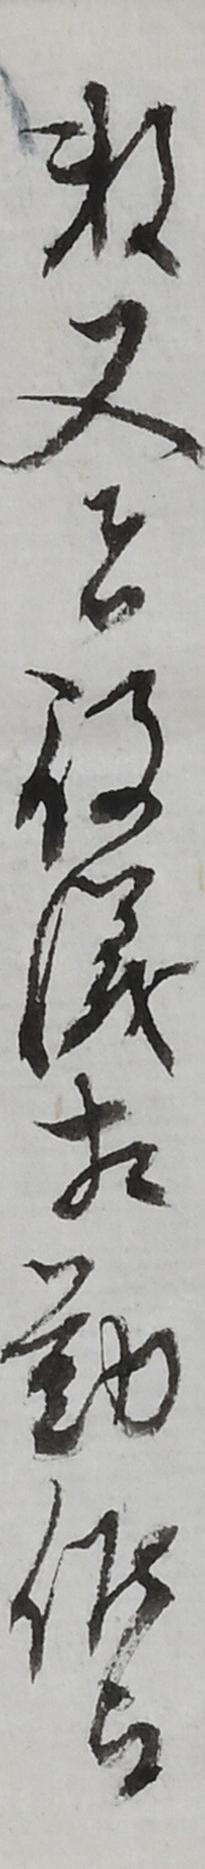数又は役儀相勤候と
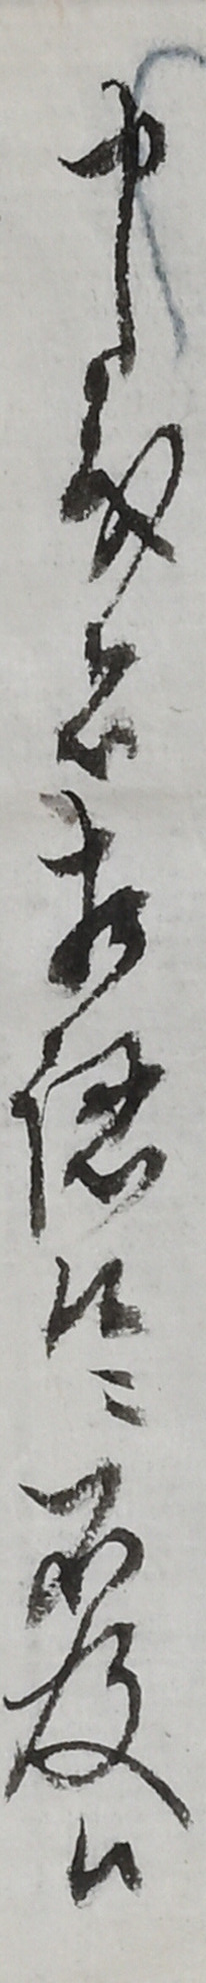申義は相認候ニ不及候
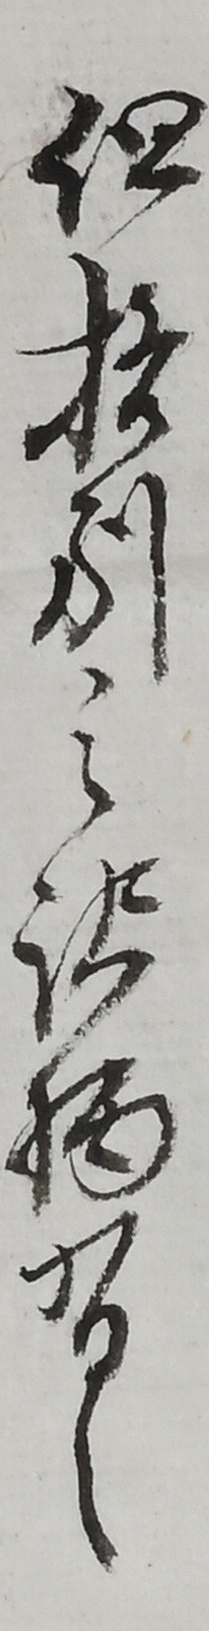但格別之訳柄有之
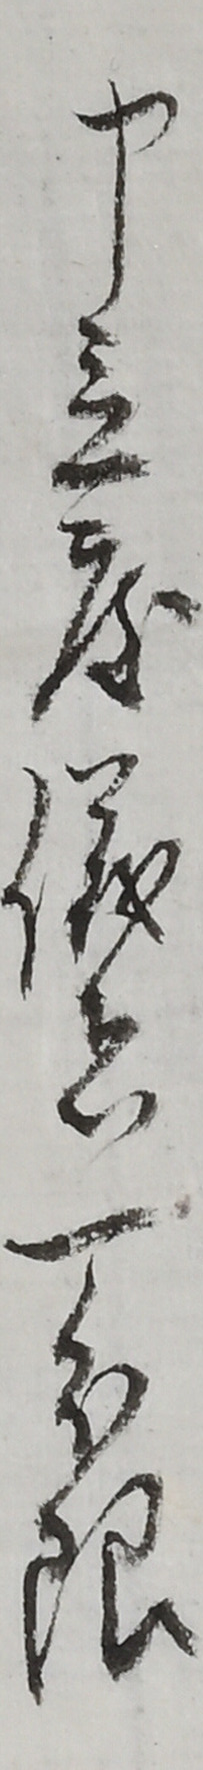申立度儀は一分限
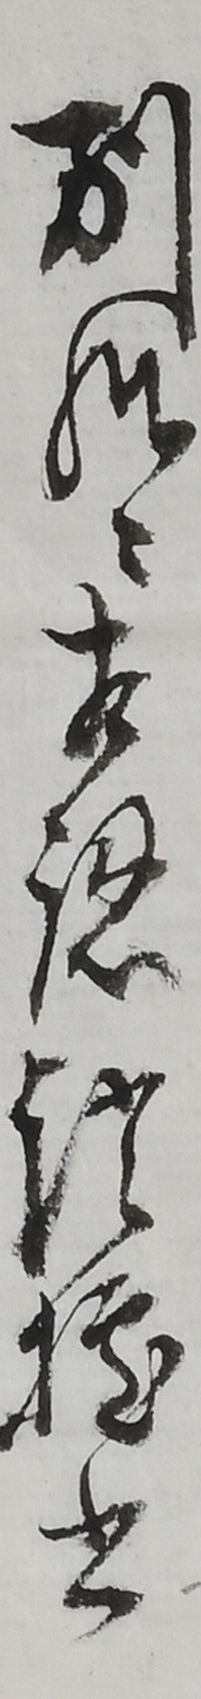別紙ニ相認証拠書
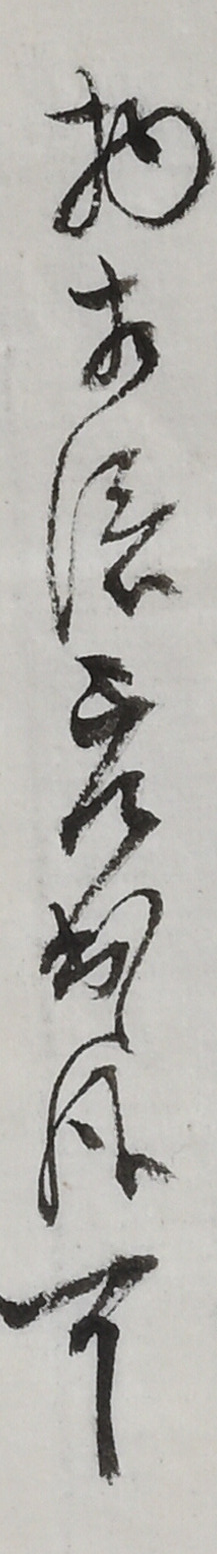物相信差出候様可
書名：百五拾年御祝御用手控
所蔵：伊那市立高遠町図書館・合同会社AMANE
